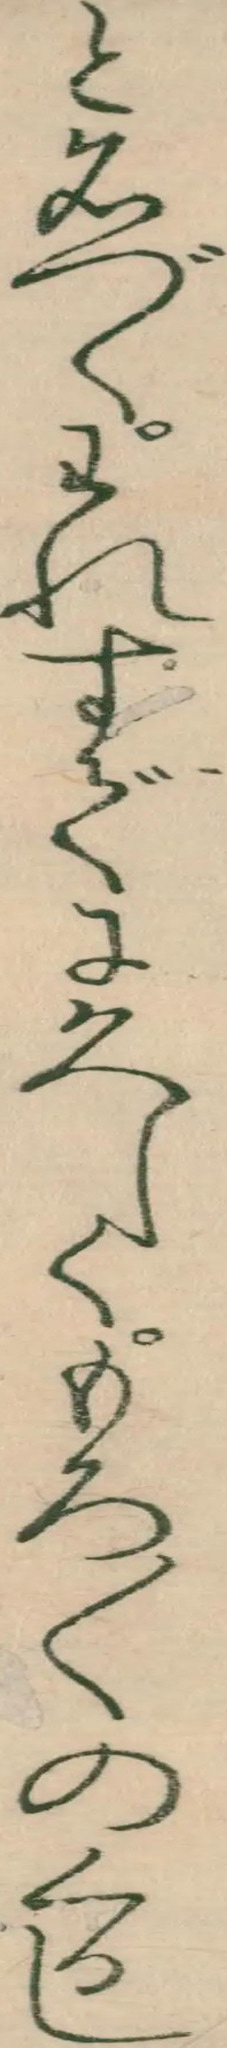と名づく。われすでに久しく。もろ〳〵のくるし
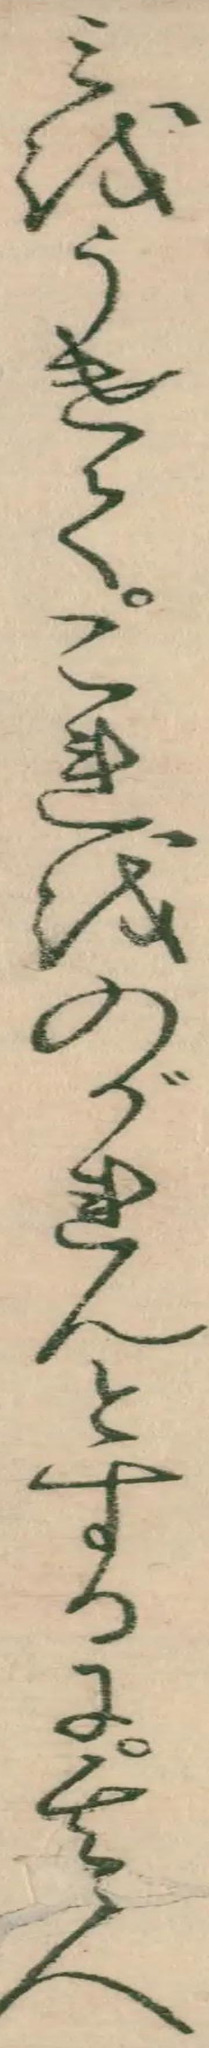みをうけて。これをのがれんとするに。其人
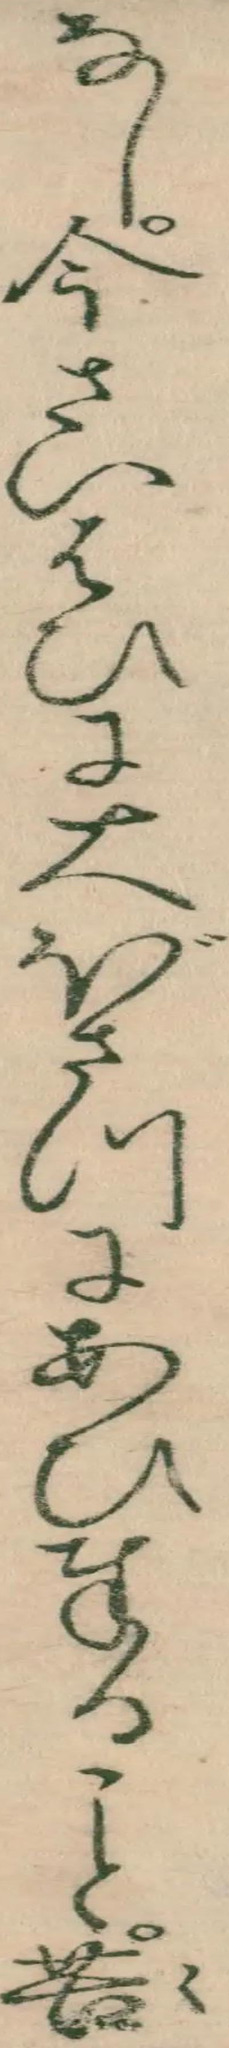なし。今さいはいに大ぼさつにあひ奉ること。苦
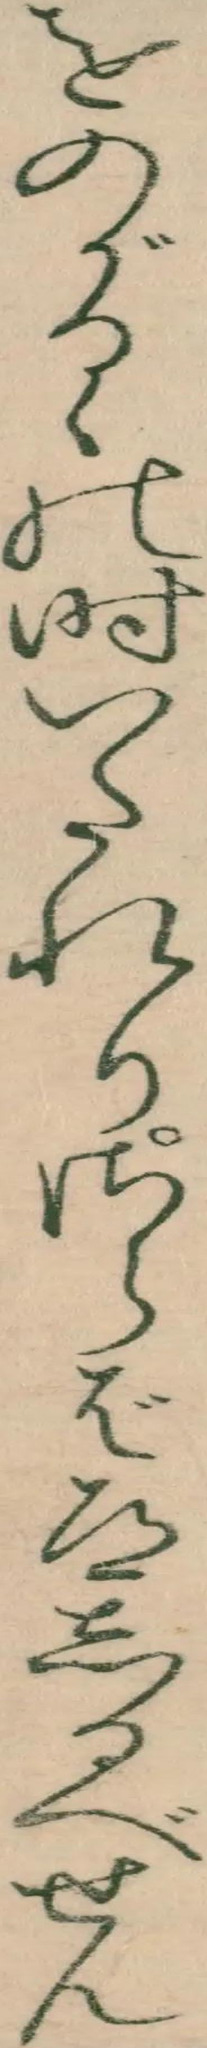をのがるゝの時いたれり。さらば道しるべせん
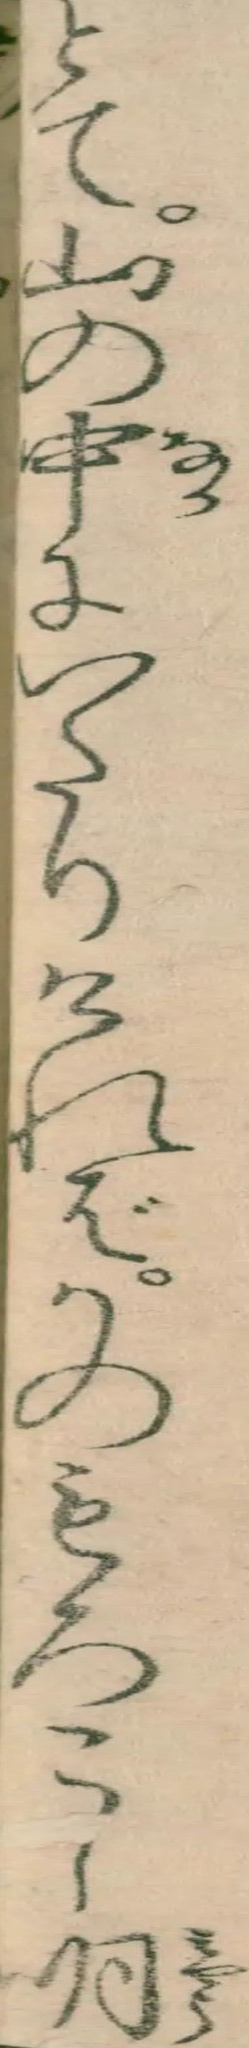とて。山の中にいたりければ。かのもろこし明
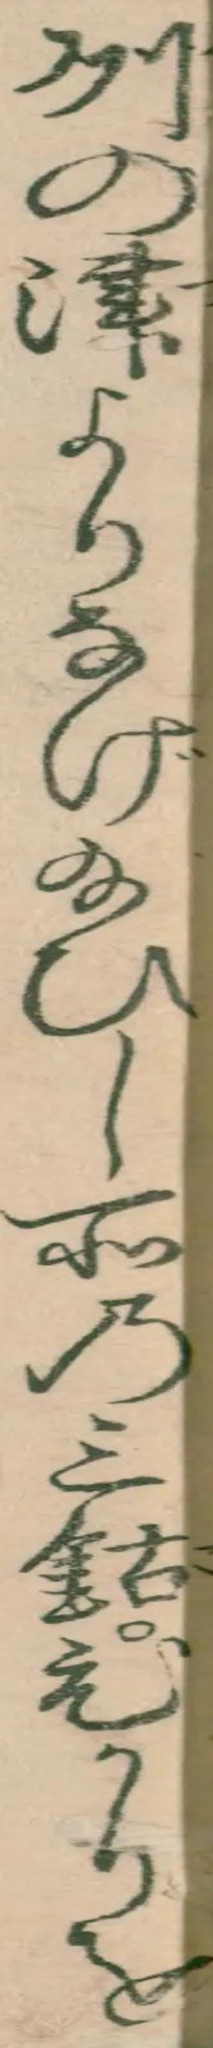州の津よりなげ給ひし所の三鈷。ひかりを
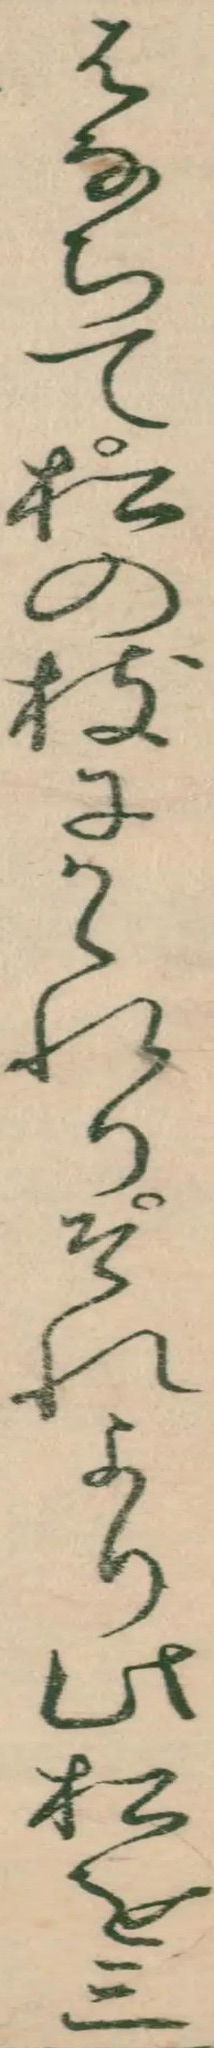はなちて。松の枝にかゝれり。それより此松を三
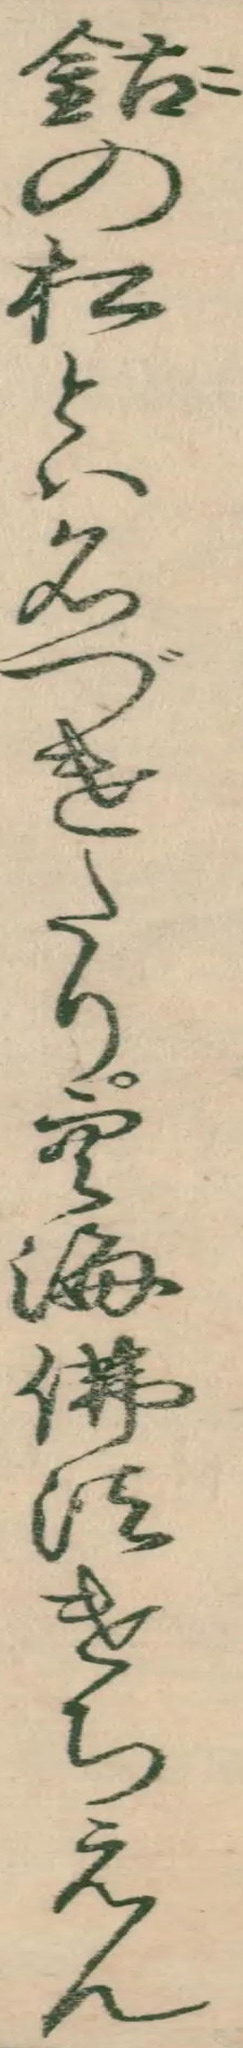鈷の松とはなづけたり。空海仏法けちえん
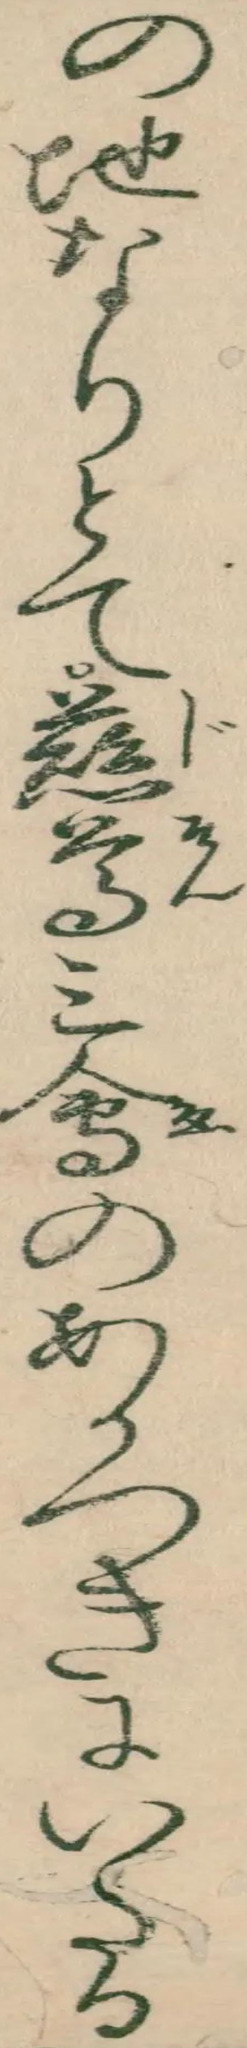の地なりとて。慈尊三会のあかつきにいたる
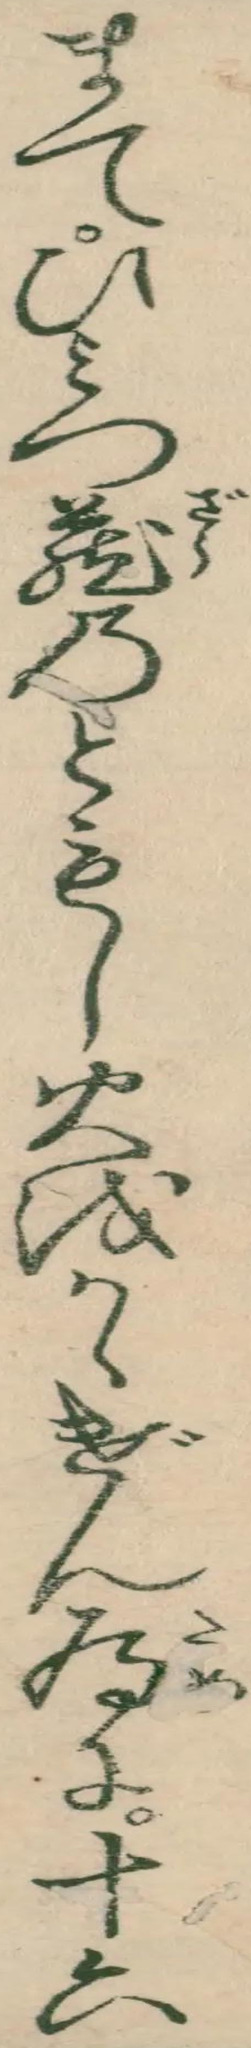まて。ひみつ蔵のともし火をかゝげん為に。十六
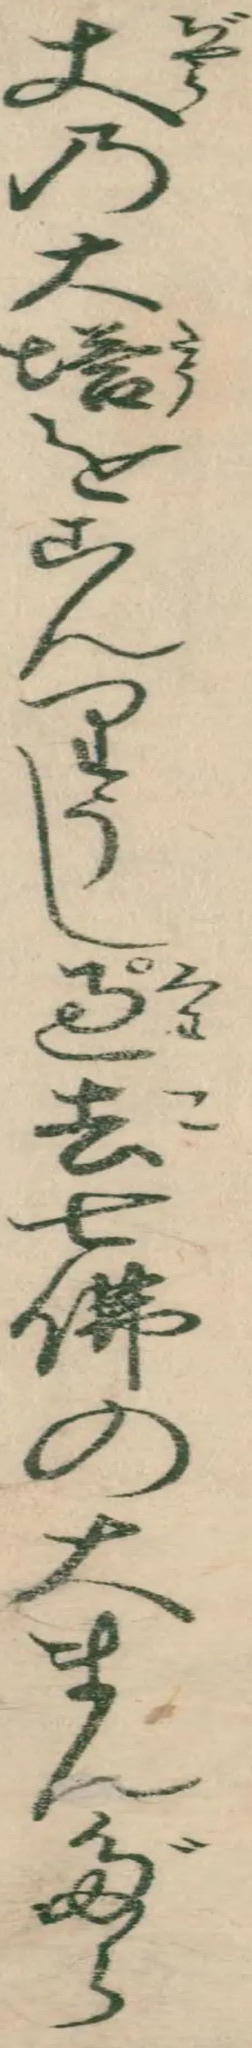丈の大塔をこんりうし。過去七仏の大まんだら
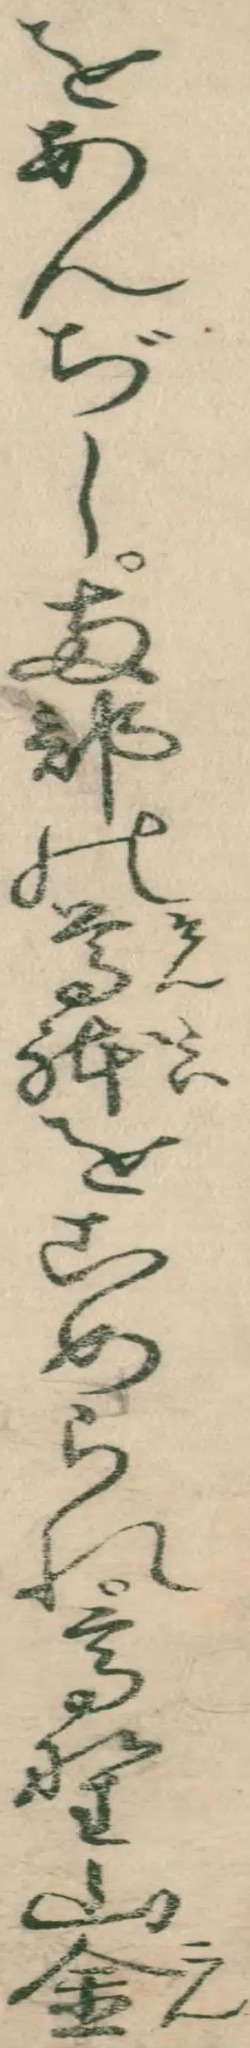をあんぢし。両部の尊体をこめられ。高野山金
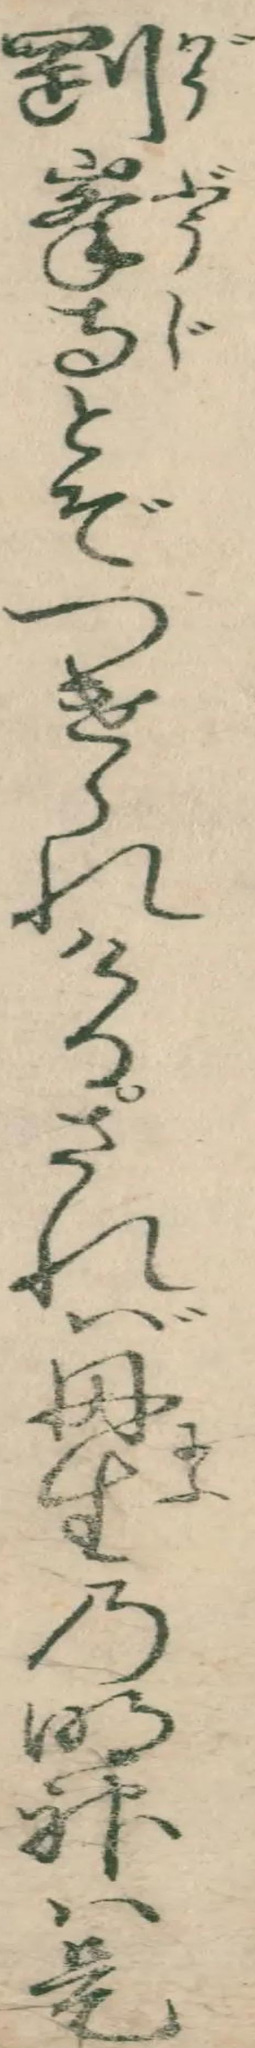剛峯寺とぞつけられける。されば丹生の明神は是
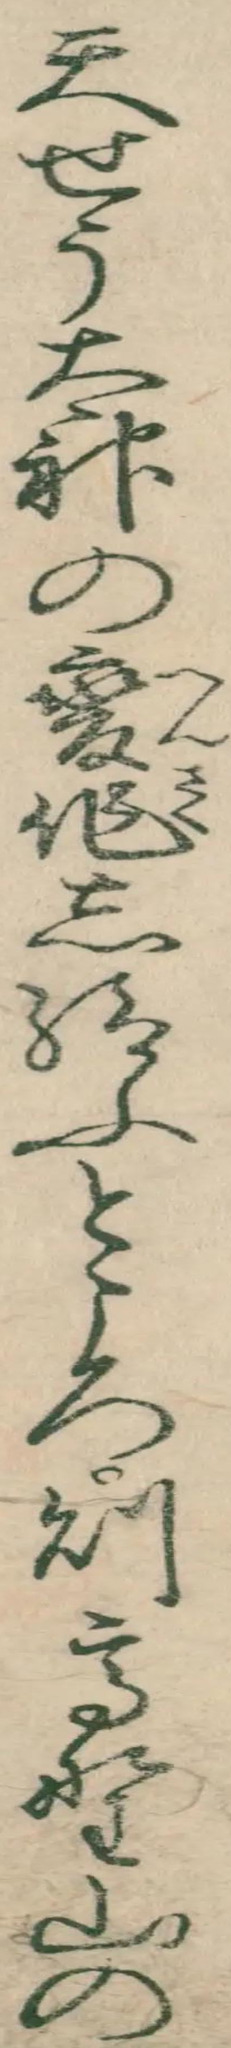天せう太神の変作し給ふところ。則高野山の
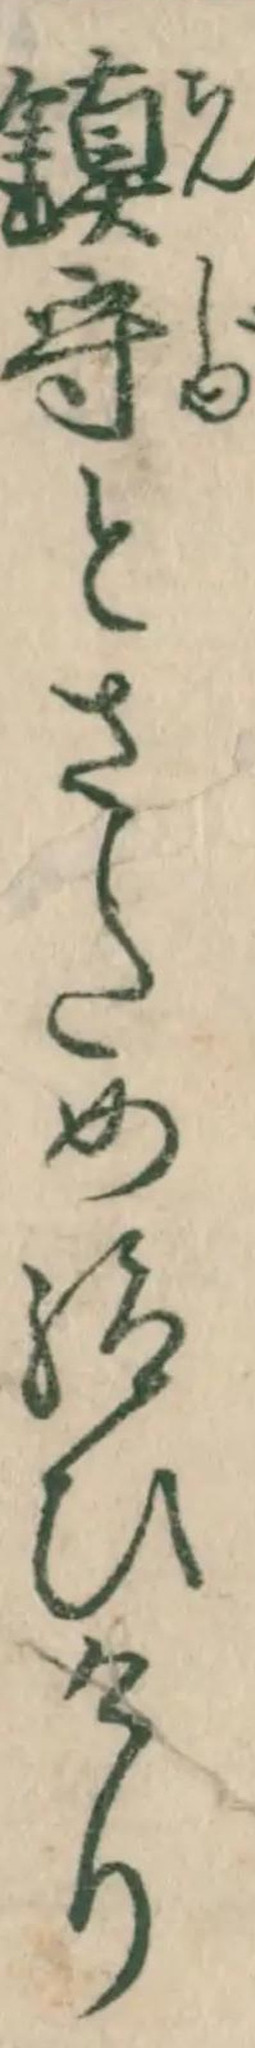鎮守とさため給ひけり

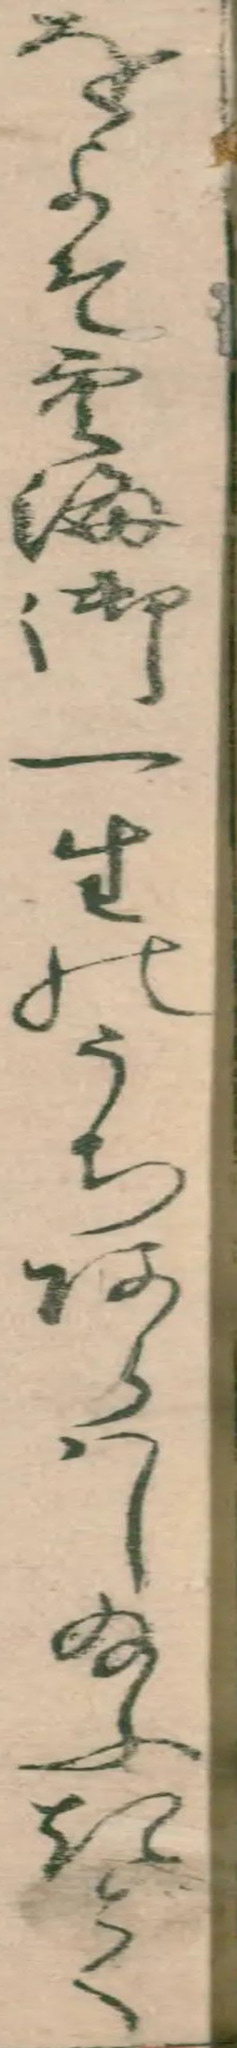をよそ空海御一生のうちあらはし給ふきどく
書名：弘法大師御本地 3巻. [2]
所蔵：国立国会図書館 National Diet Library, JAPAN
